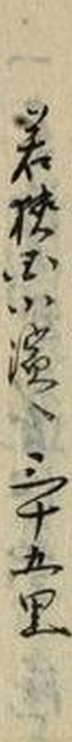若狭国小浜へ三十五里
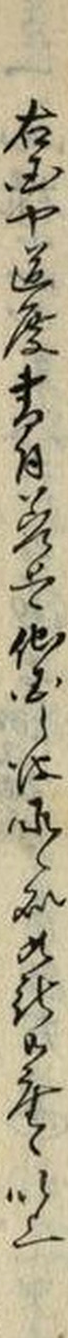右国中道度書付差上候他国之儀承候処如此御座候以上
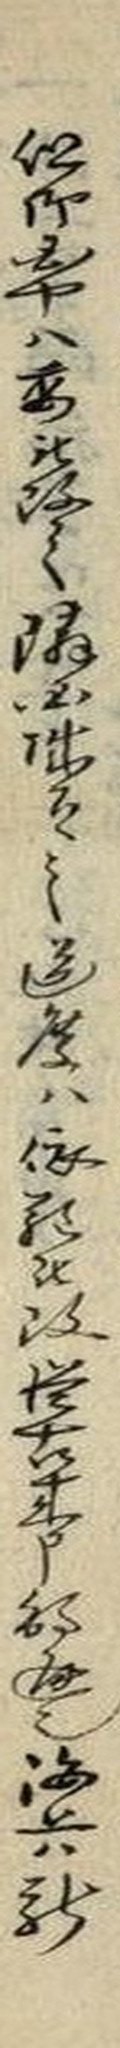但御国中ハ委被改之隣国城下へ之道度ハ依難被改従古来申触通也海上ハ新
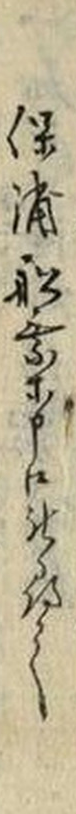保浦船乗等申口被尋之
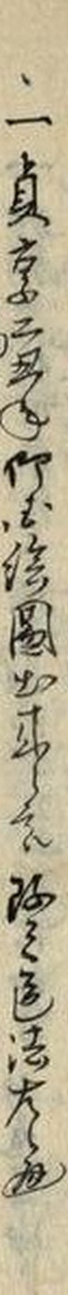一貞享二丑年御国絵図出来候節改之道法左之通
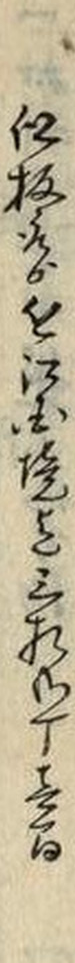但板取ゟ近江国境迄三拾弐丁壱間
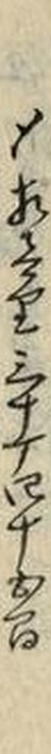〆拾壱里三十丁四十五間
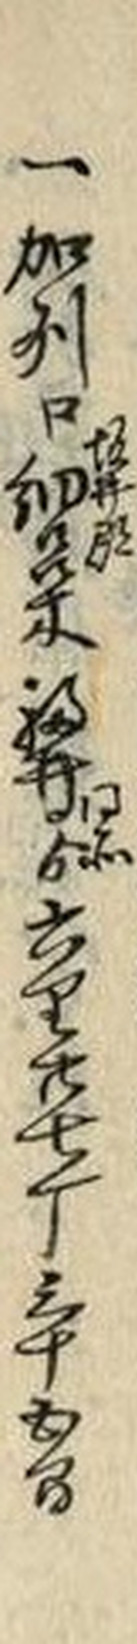一加州口坂井郡細呂木福井同所ゟ六里廿七丁三十五間
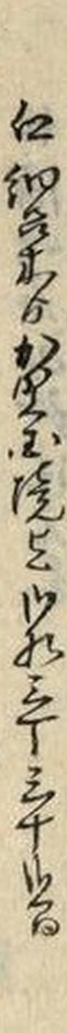但細呂木ゟ加賀国境迄弐拾三丁三十弐間
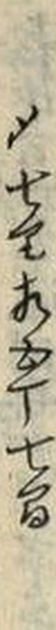〆七里拾五丁七間
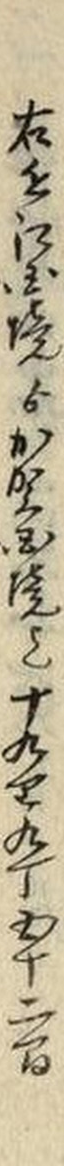右近江国境ゟ加賀国境迄十九里九丁五十二間

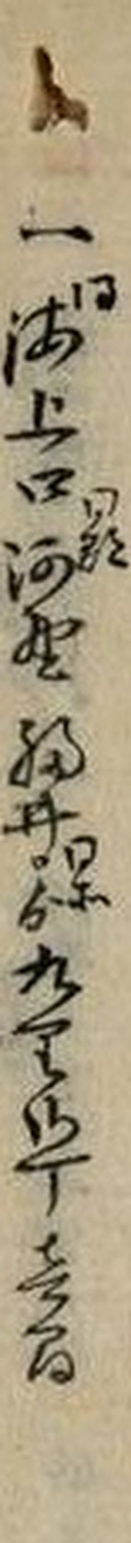一同海上口同郡河野福井同所ゟ九里弐丁壱間
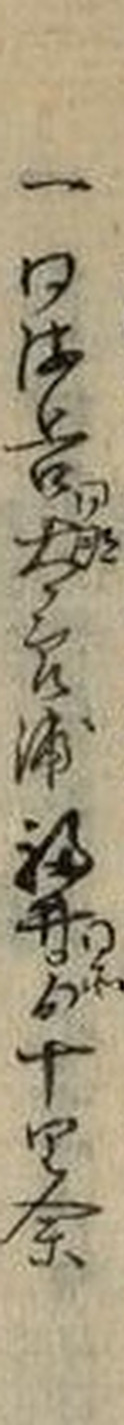一同海上口同郡太良浦福井同所ゟ十里余
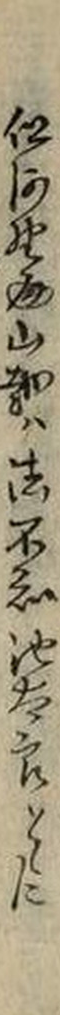但河野通山越ハ法不知池太良ともに
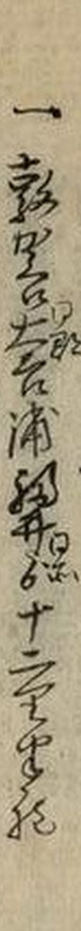一敦賀口同郡大谷浦福井同所ゟ十二里半程
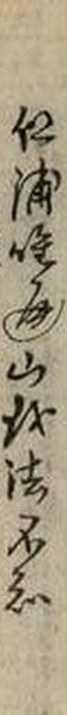但浦唯？通山越法不知
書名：御国他国諸事之部
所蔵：福井県文書館 Fukui Prefectural Archives
